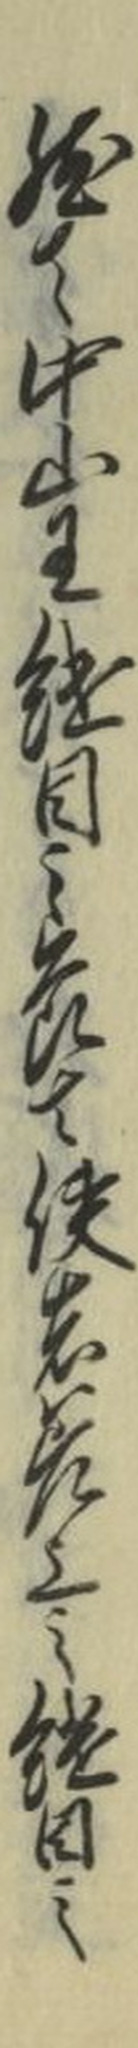然は中山王継目之節は使者差上之継目之
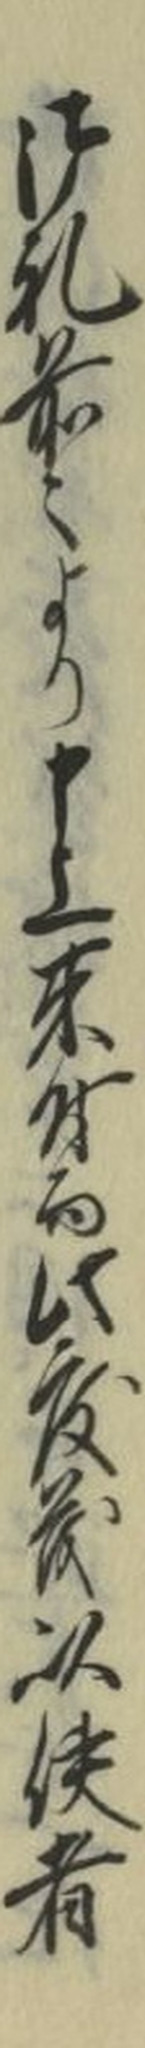御礼前々より申上来付而此度も以使者
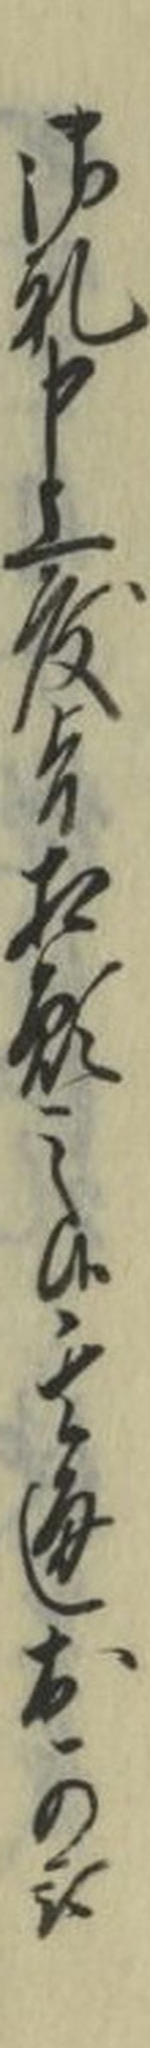御礼申上度旨相願之候其通書可被
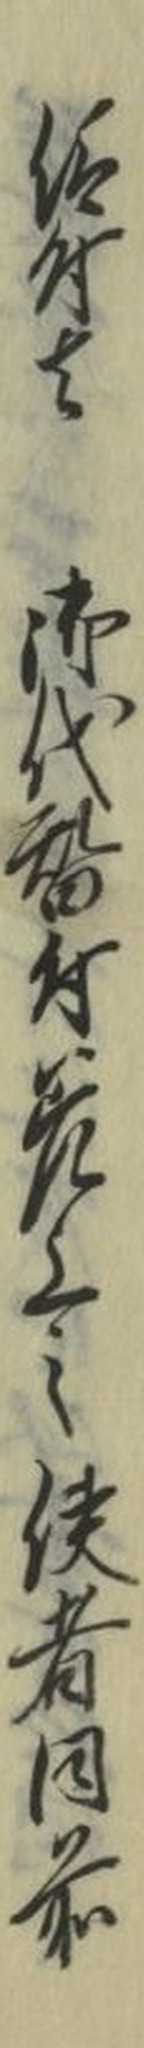仰付は御代替付差上之使者同前

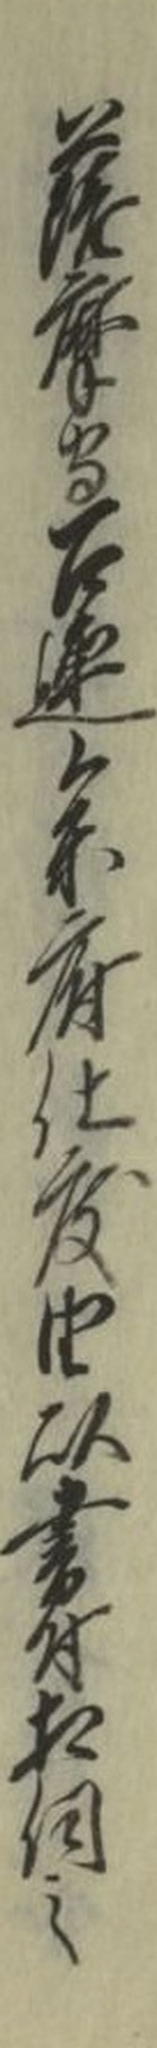薩摩守召連参府仕度由以書付相伺之
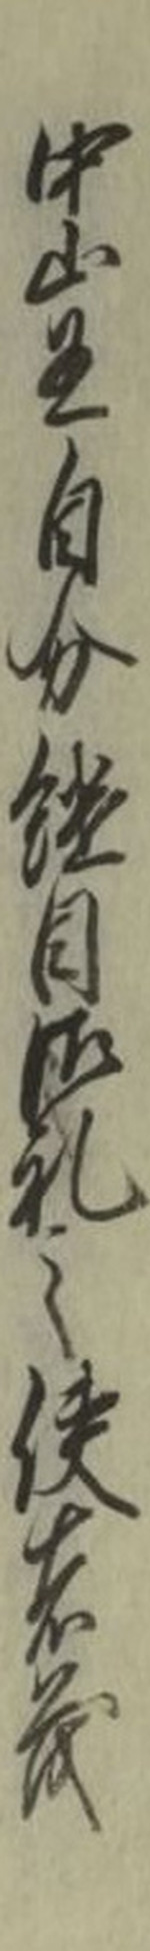中山王自分継目御礼之使者も
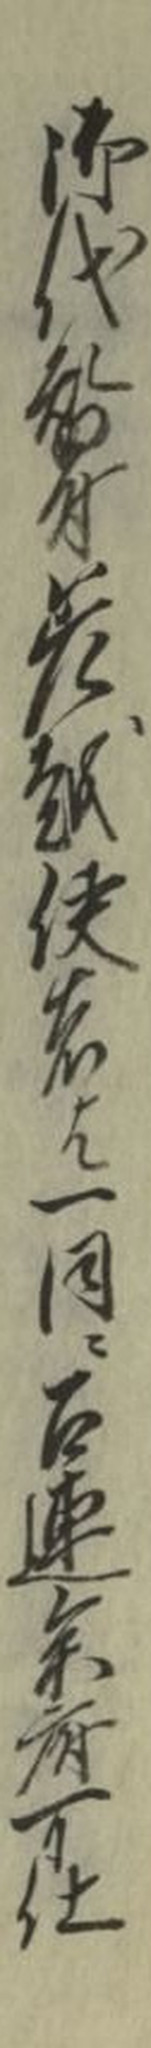御代替付差越使者は一同ニ召連参府可仕
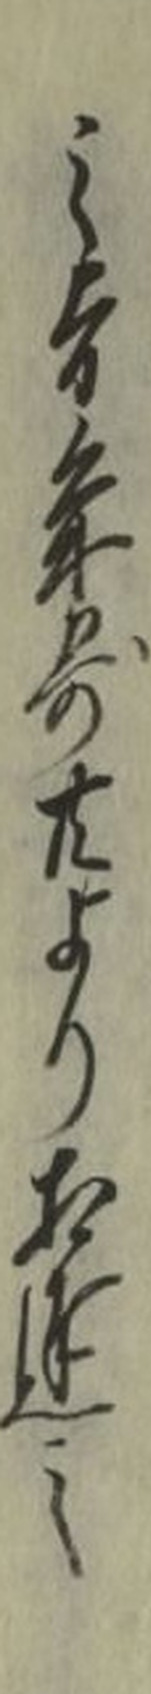之旨年寄共より相達之
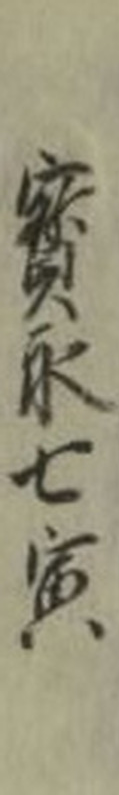宝永七寅
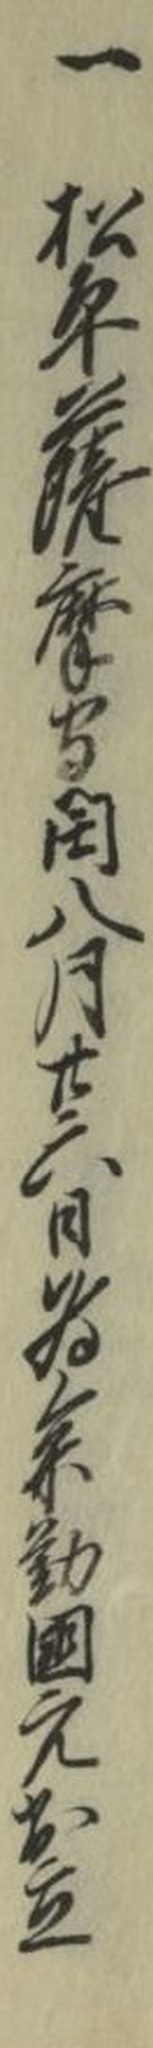一松平薩摩守閏八月廿六日為参勤國元出立
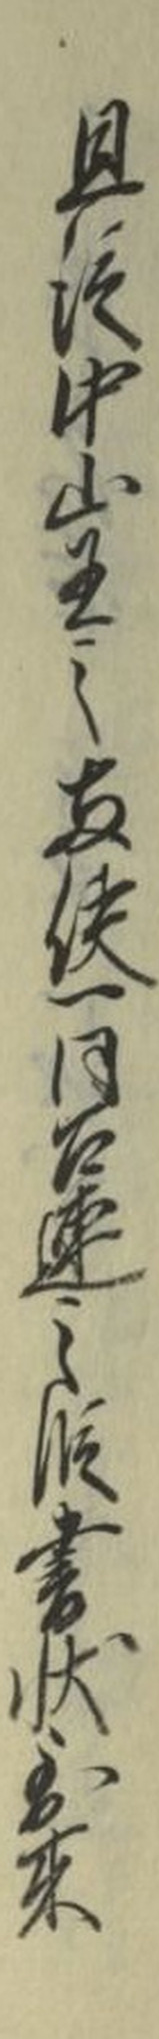且従中山王之両使一同召連之段書状到来
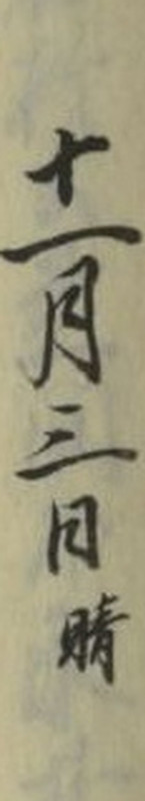十一月三日晴
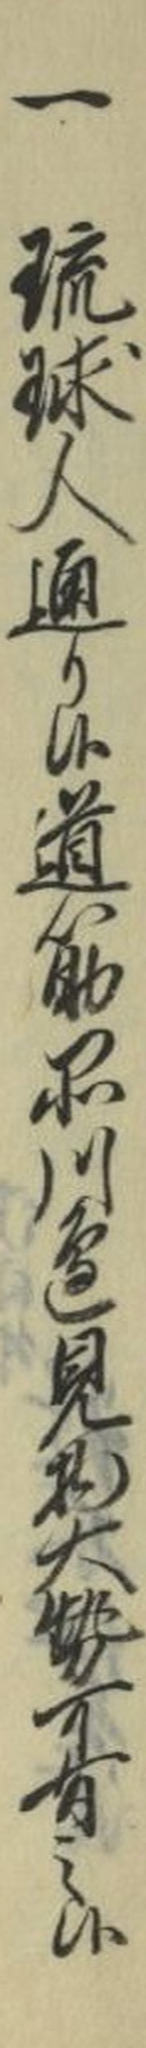一琉球人通り候道筋品川邊見物大勢可有之候
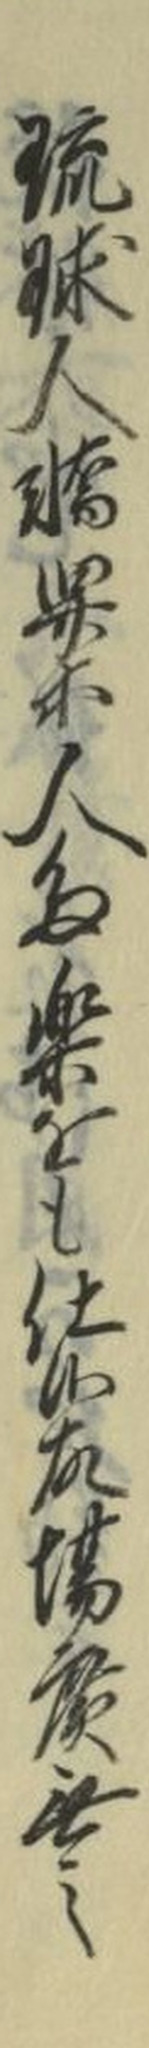琉球人轎輿等人多楽をも仕候故場廣無之
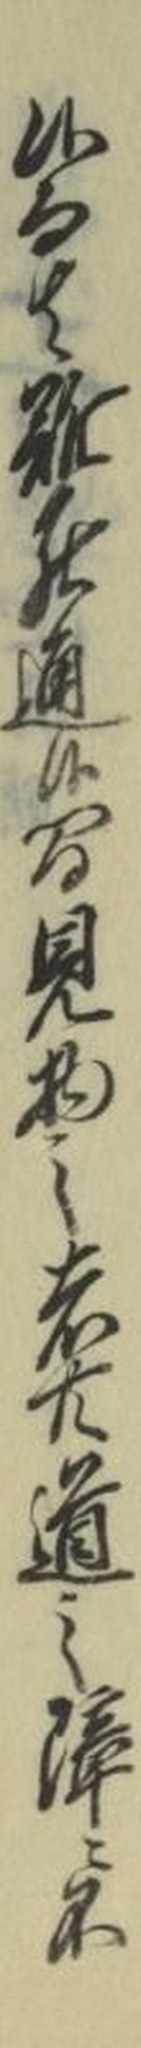候而者難罷通候間見物之者共道之障ニ不
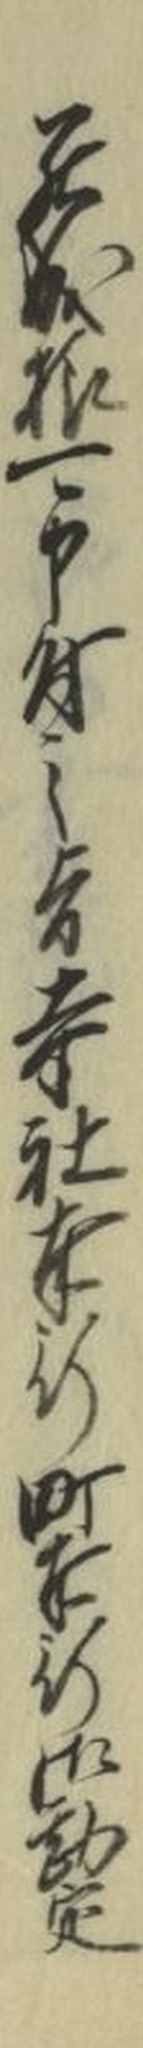罷成様可申付之旨寺社奉行町奉行御勘定
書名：琉球人参府記
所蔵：University of the Ryukyus Library
